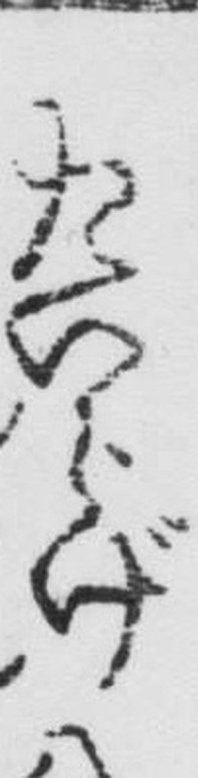たいらげ
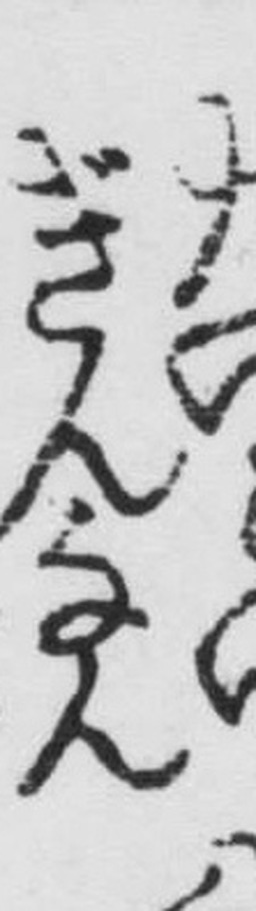ぎんなん
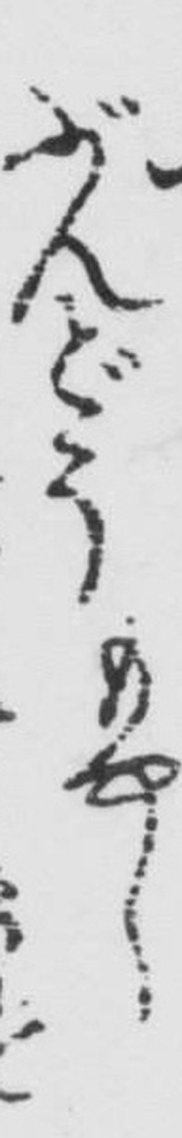ぶんどうもやし
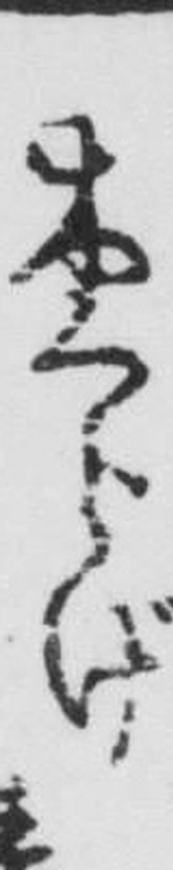木くらげ
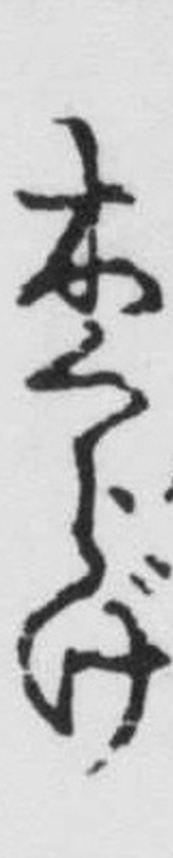木くらげ
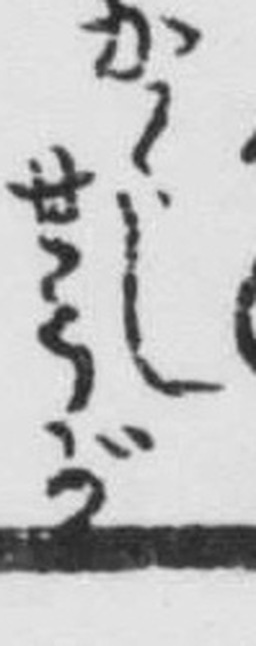せうが
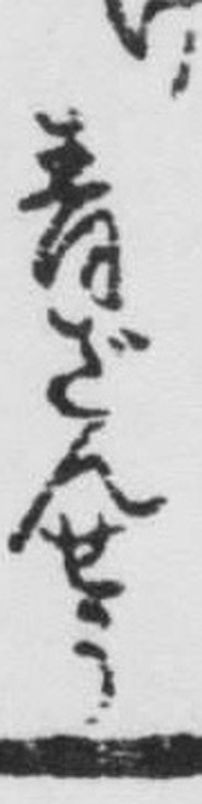青ざんせう
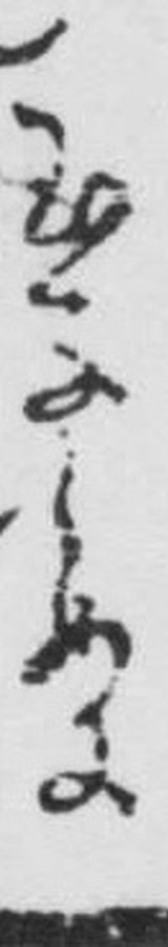〽玉子しめ
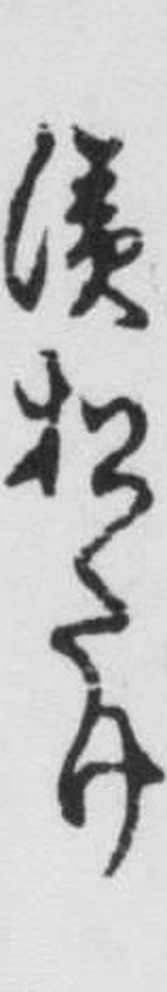漬松たけ
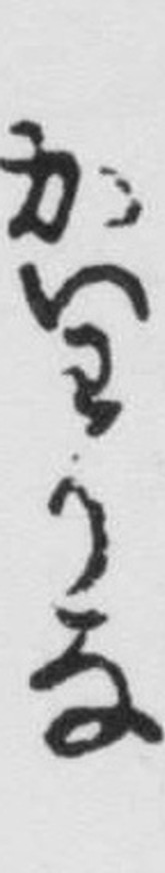かいわりな
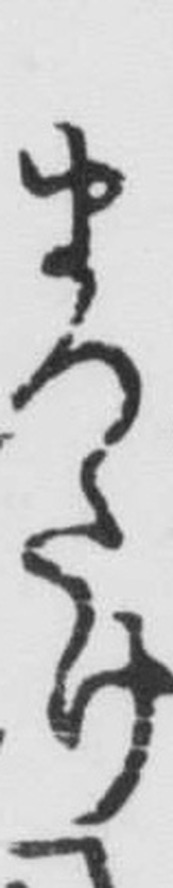まつたけ
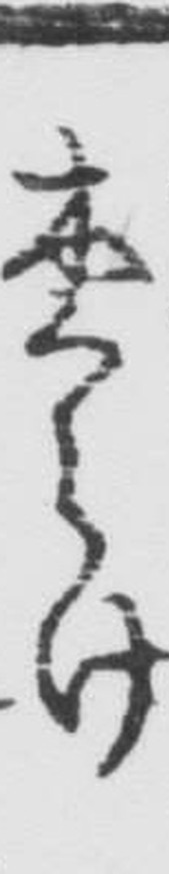木くらけ
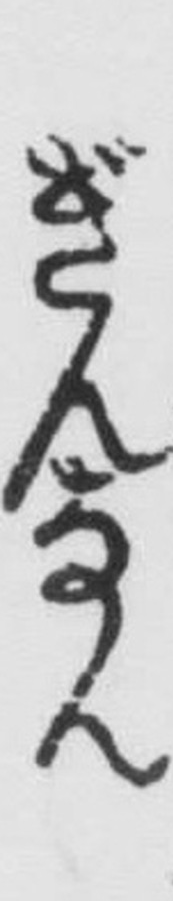ぎんなん
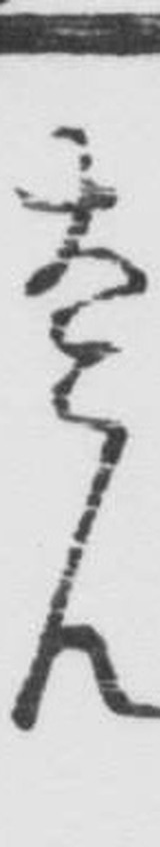大こん
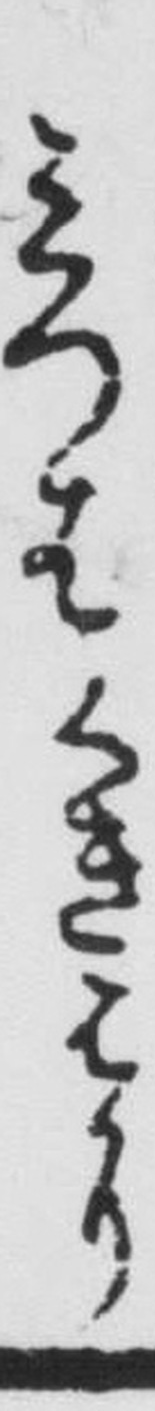みつはくきはかり
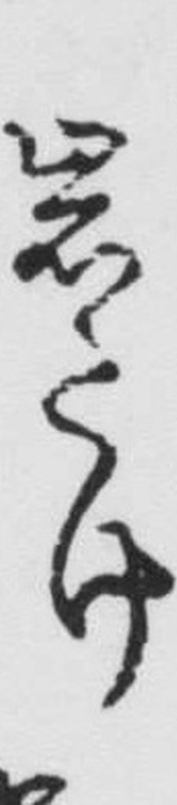岩たけ
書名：諸家通用/即席料理
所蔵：大阪府立大学学術情報センター 国文学研究資料館
